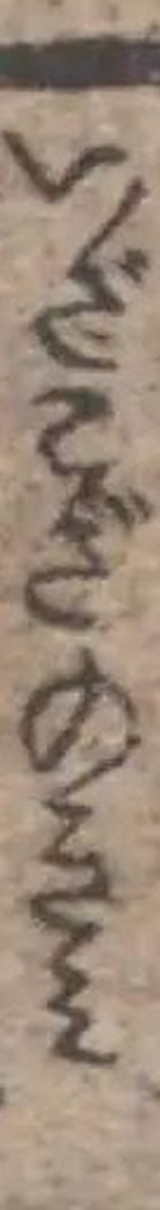いざこざのきミ
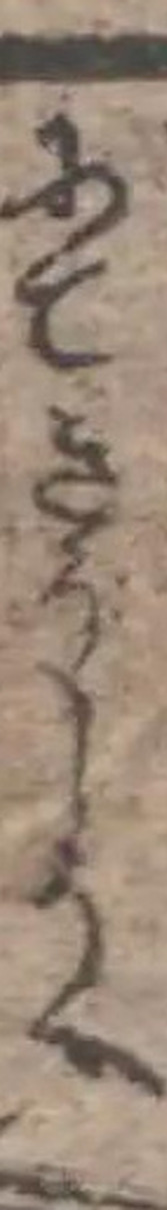にてきうしうへ
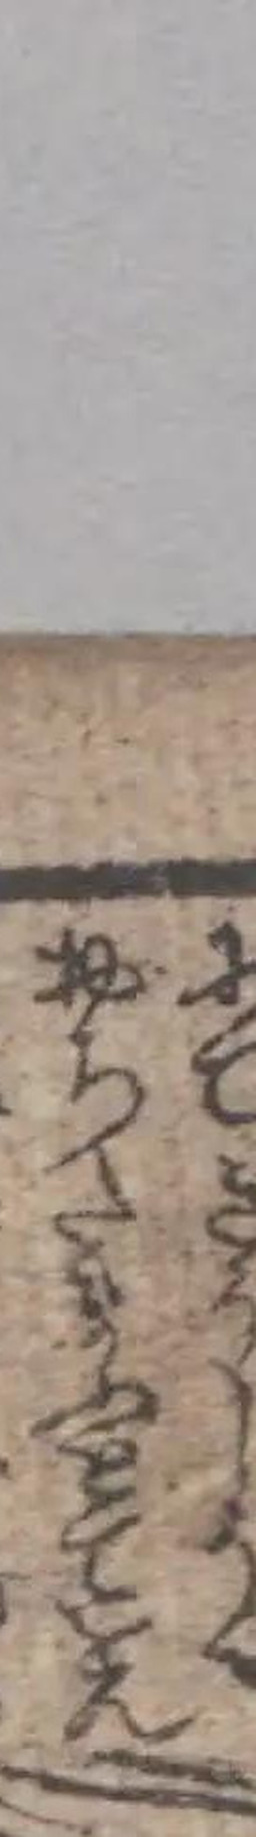おちたまふとてをん
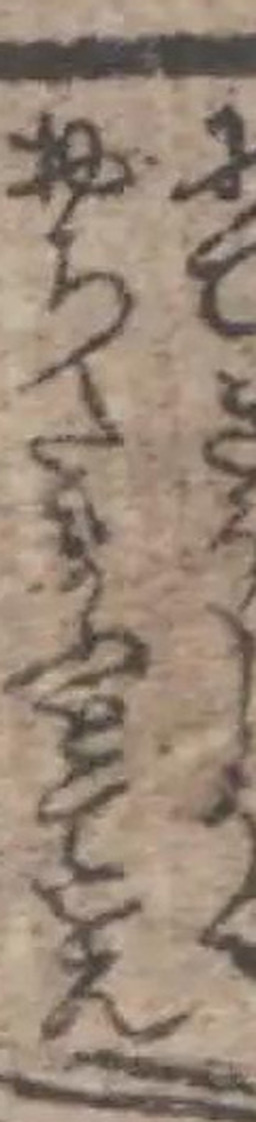おちたまふとてをん
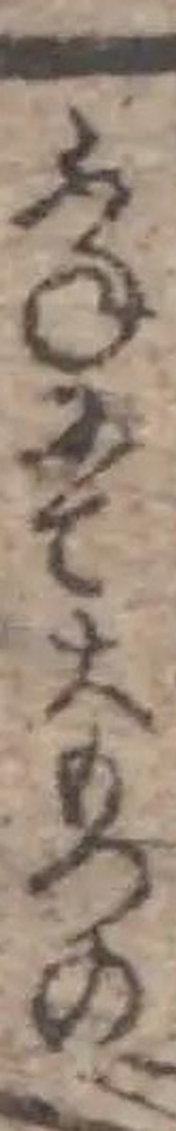ふねにて大もつの
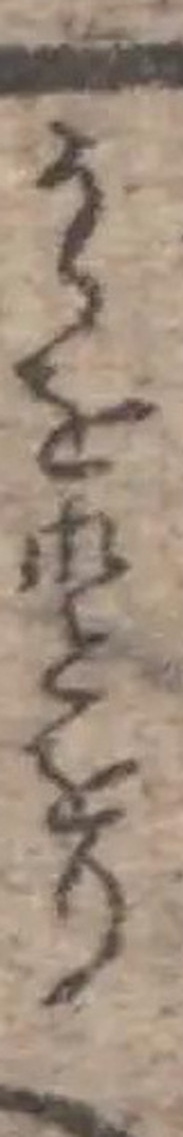うらを御とをり
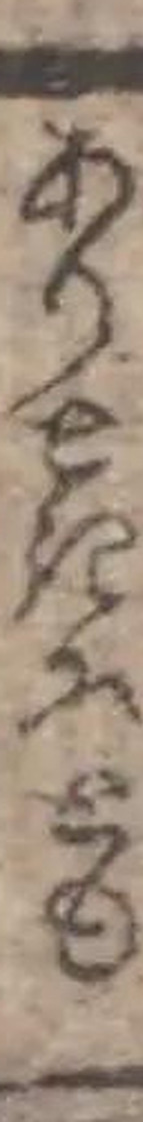ありときにとも
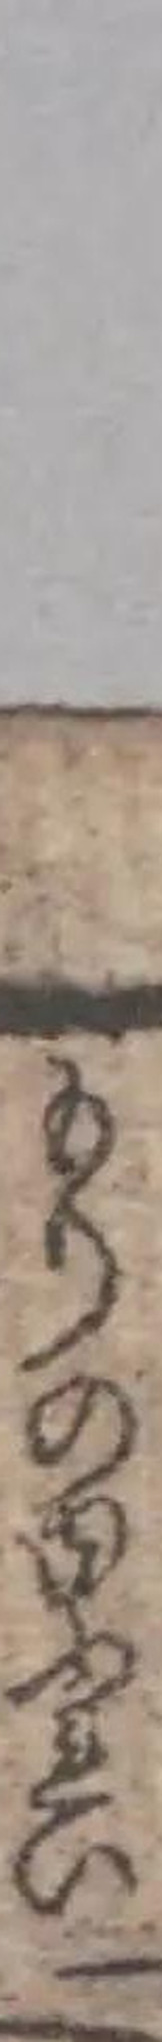もりのゆふれい
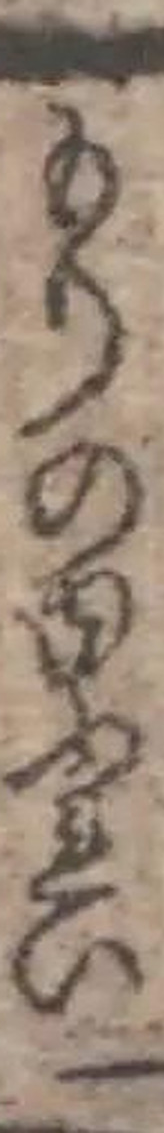もりのゆふれい
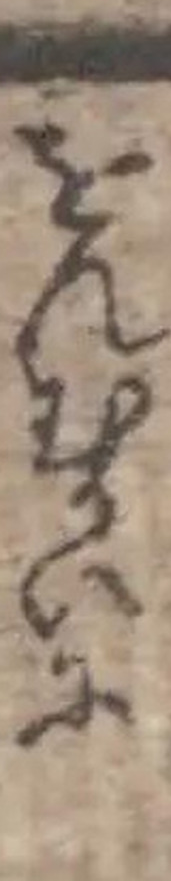をんむかいに
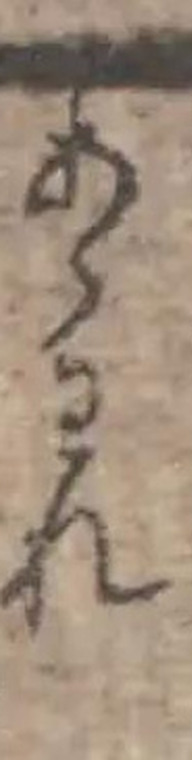あらわれ
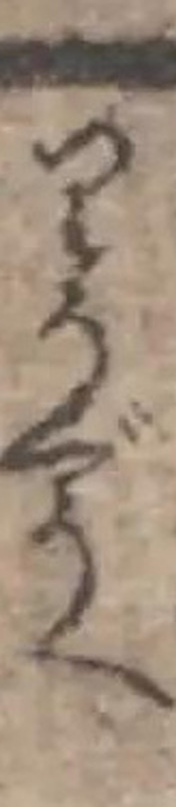りうぐうへ
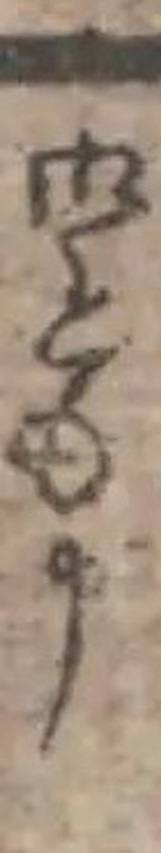御とも申
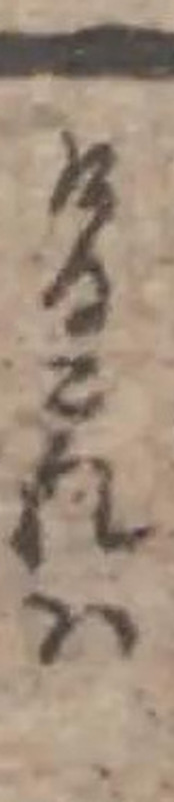けるこれハ
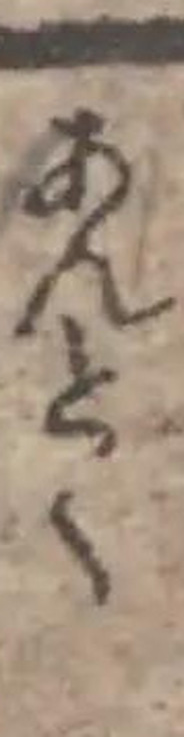あんとく
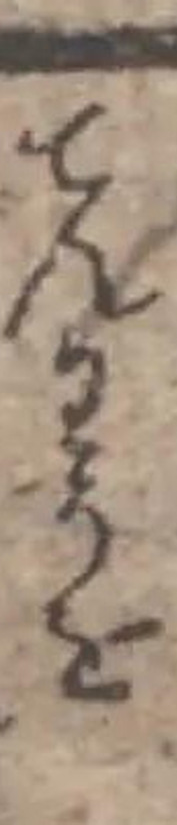てんわうを
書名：草紙の曙 3巻
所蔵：国立国会図書館 National Diet Library, JAPAN
